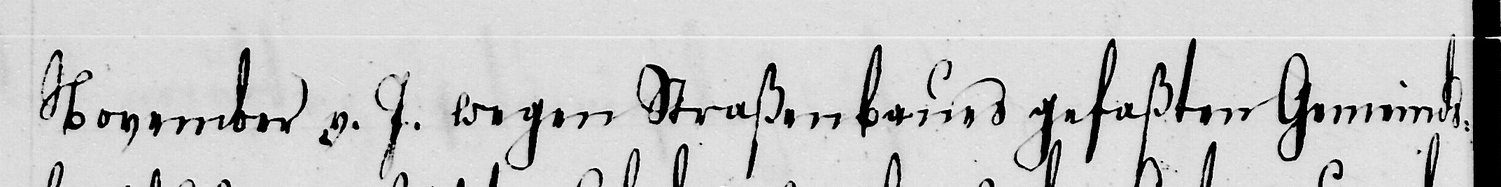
November v. J. wegen Straßenbaues gefaßten Gemeinds¬
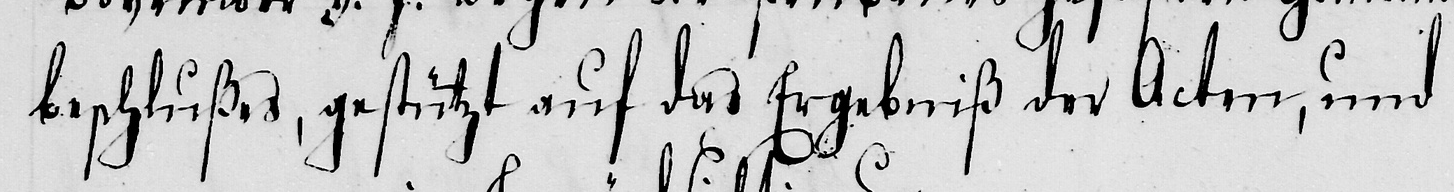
beschlußes, gestützt auf das Ergebniß der Acten und
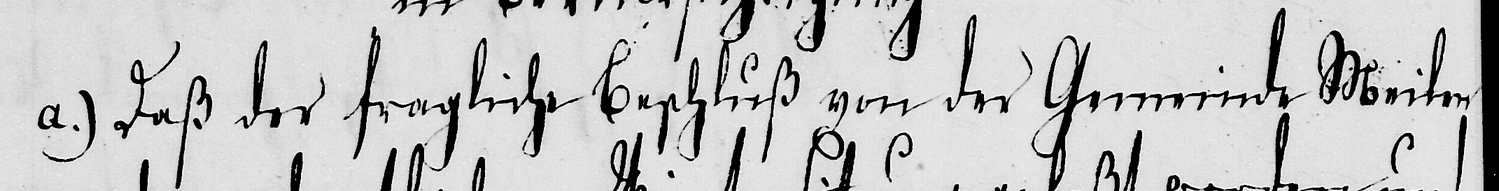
a.) Daß der fragliche Beschluß von der Gemeinde Meilen
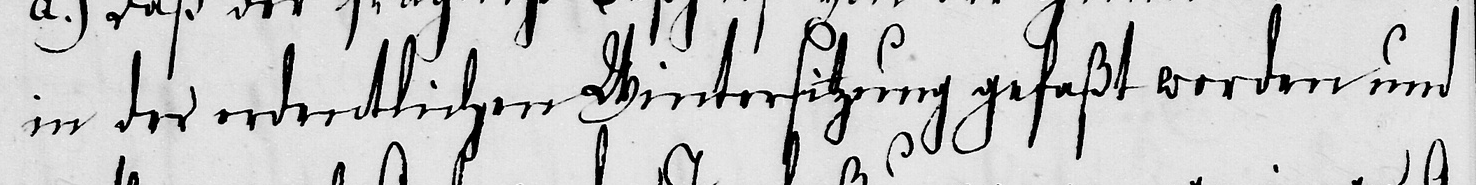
in der ordentlichen Wintersitzung gefaßt worden und
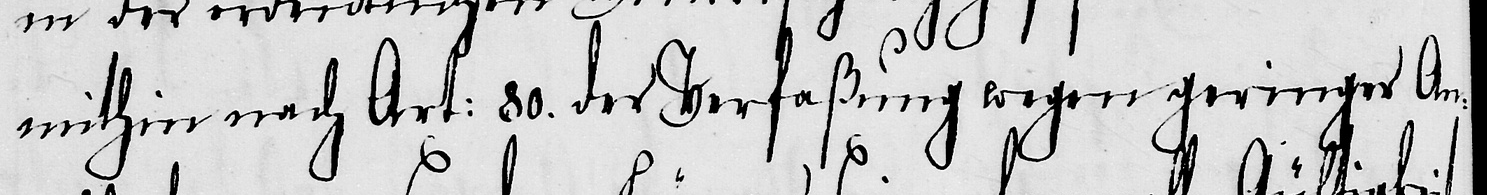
mithin nach Art: 80. der Verfaßung wegen geringer An¬
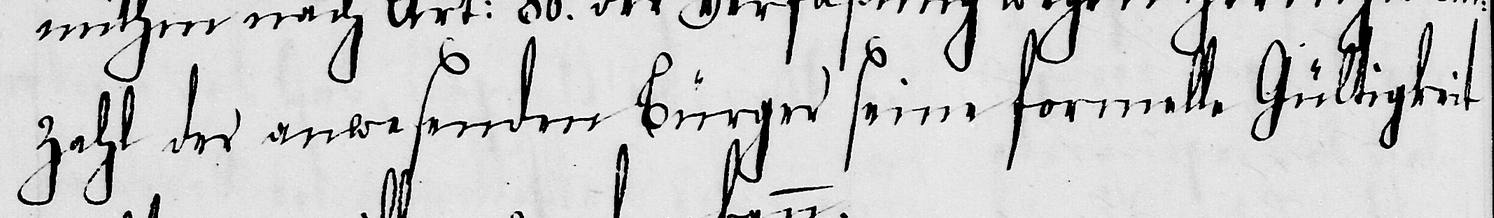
zahl der anwesenden Bürger seine formelle Gültigkeit
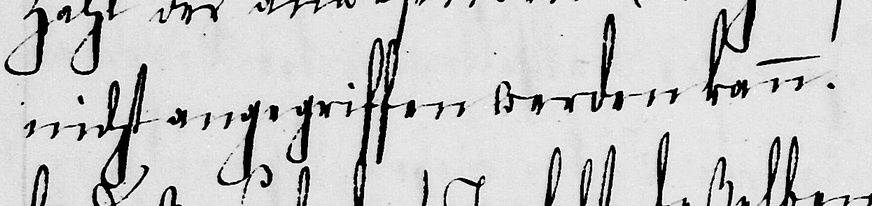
nicht angegriffen werden kann.
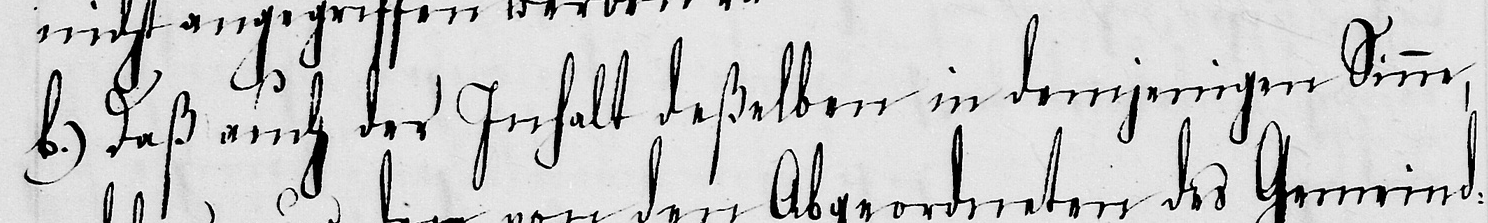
b.) Daß auch der Inhalt deßelben in demjenigen Sinne,
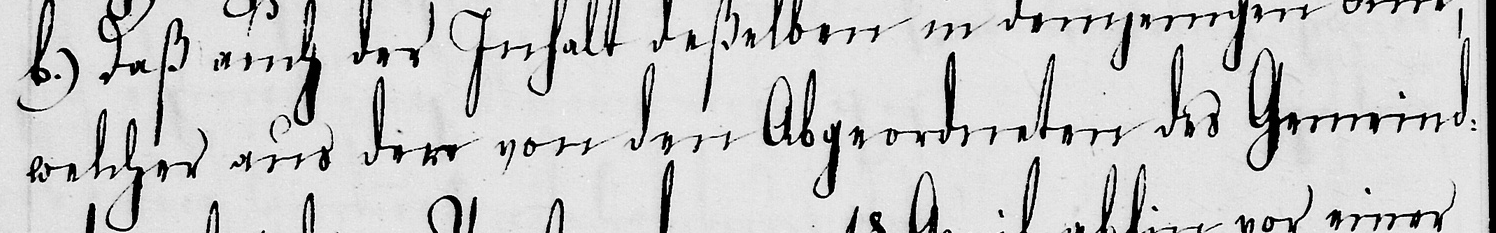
welcher aus den von den Abgeordneten des Gemeind¬
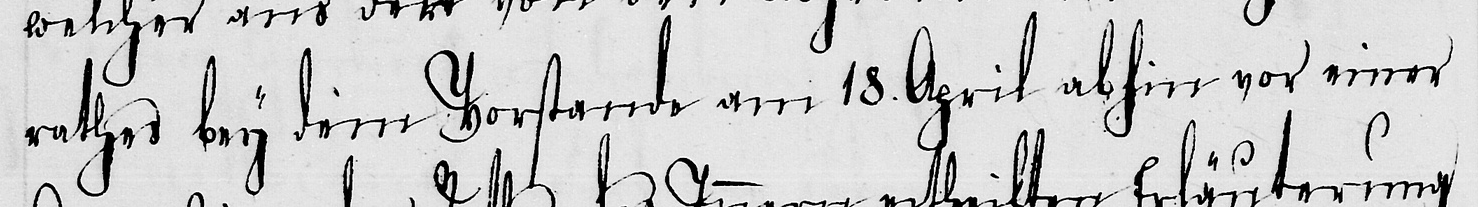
rathes bey dem Vorstande am 18. April abhin vor einer
